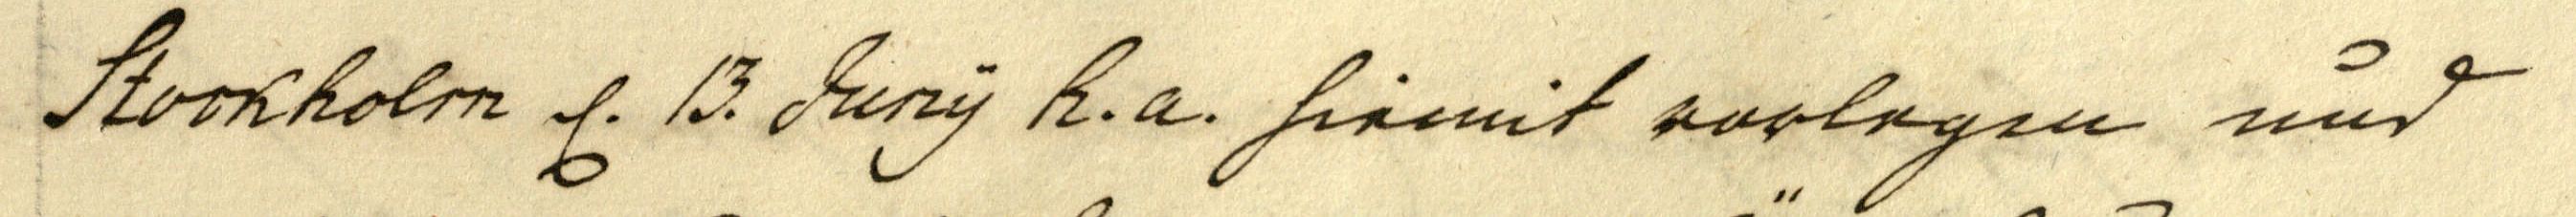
Stockholm d. 13. Juny h.a. hiemit vorlegen und
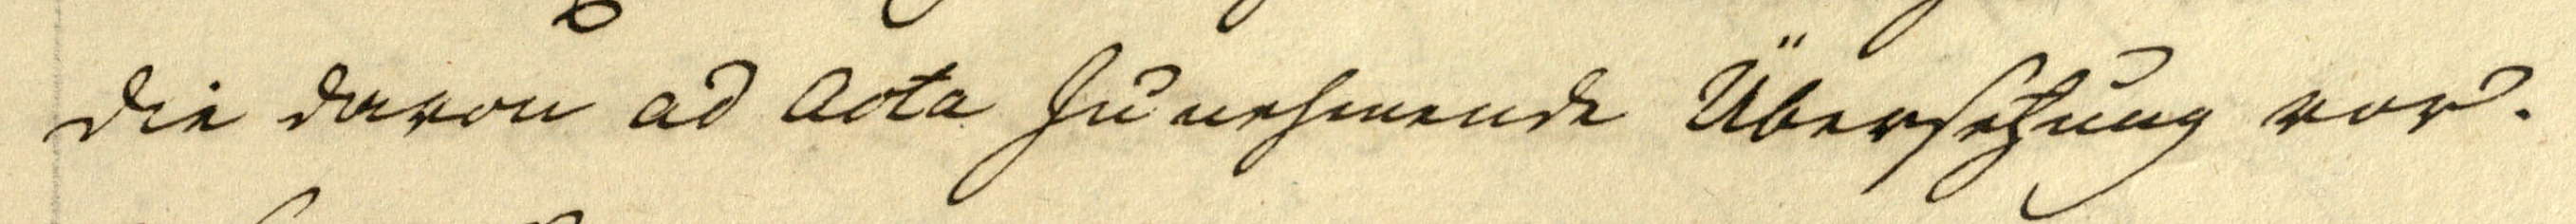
die davon ad Acta zu nehmende Übersetzung vor-
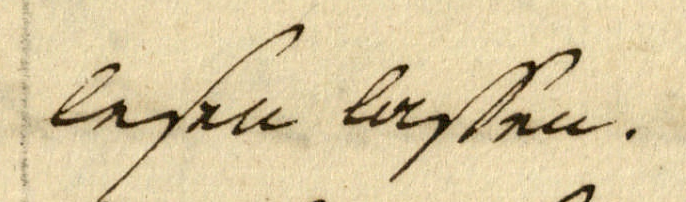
lesen lassen.
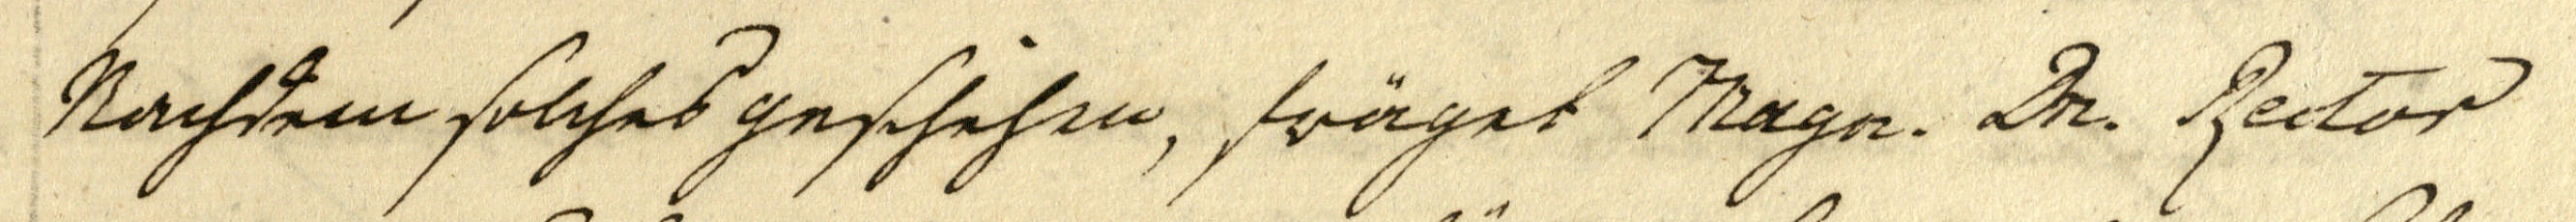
Nachdem solches geschehen, fräget Magn. Dn. Rector
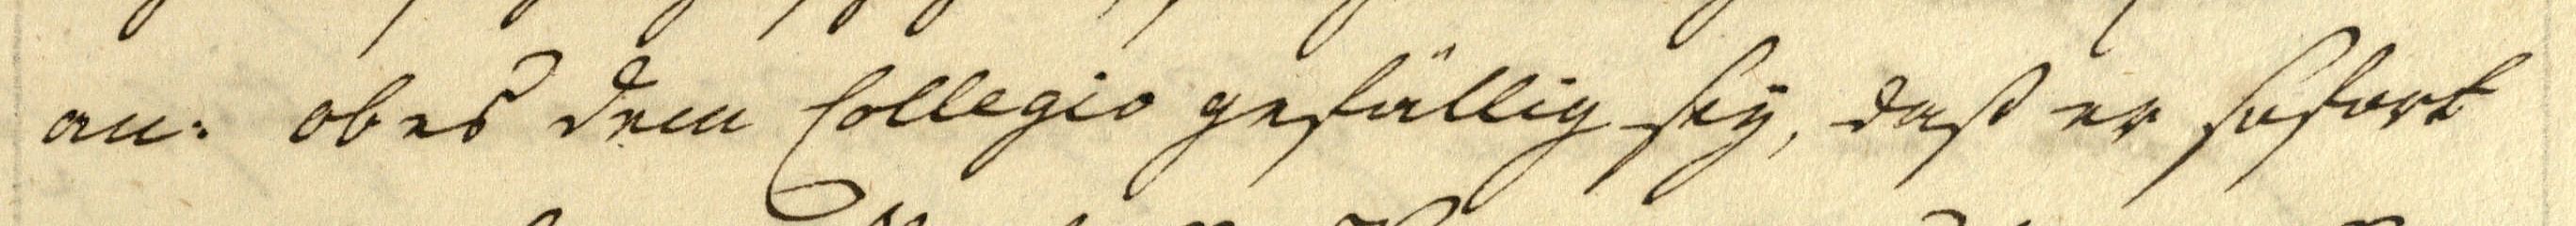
an: ob es dem Collegio gefällig sey, daß er sofort
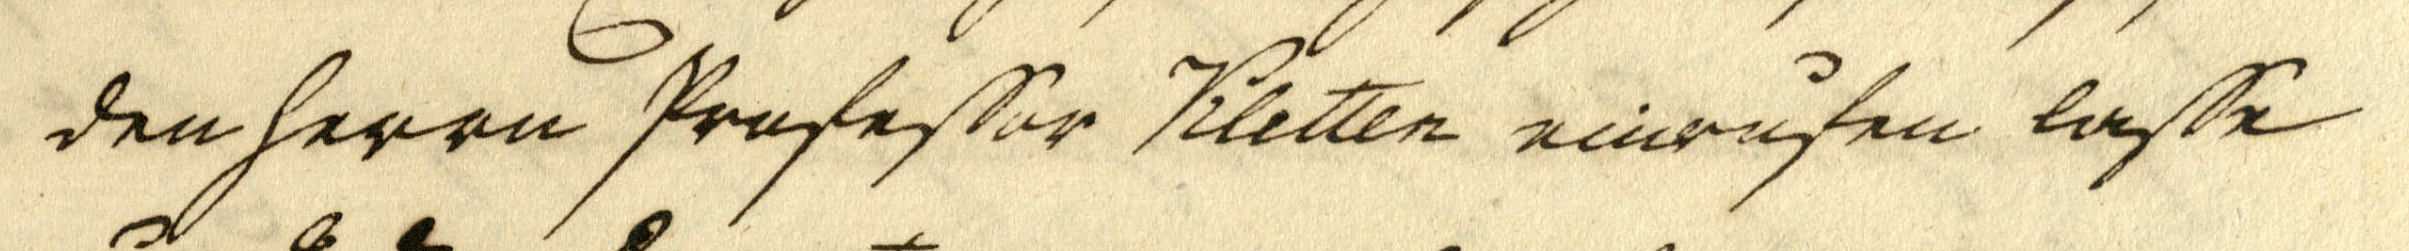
den herrn Professor Kletten einrufen lasse
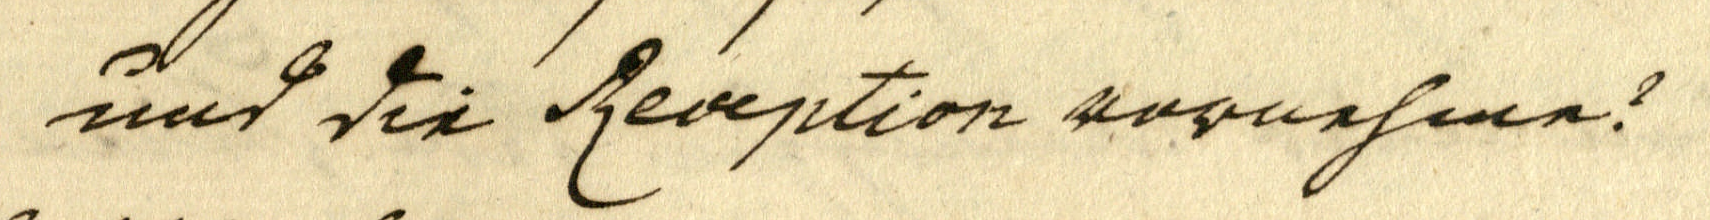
und die Reception vornehme?
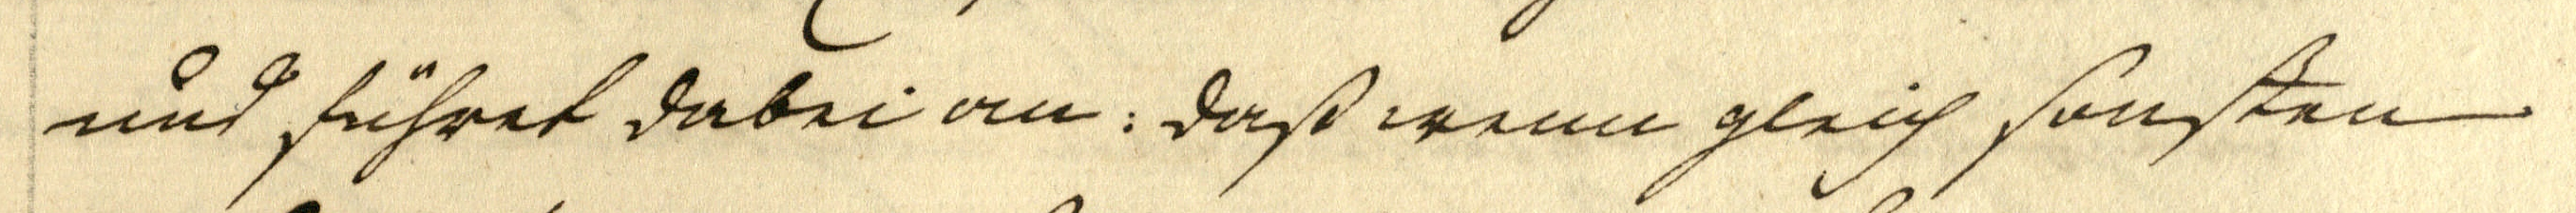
und führet dabei an: daß wenn gleich sonsten
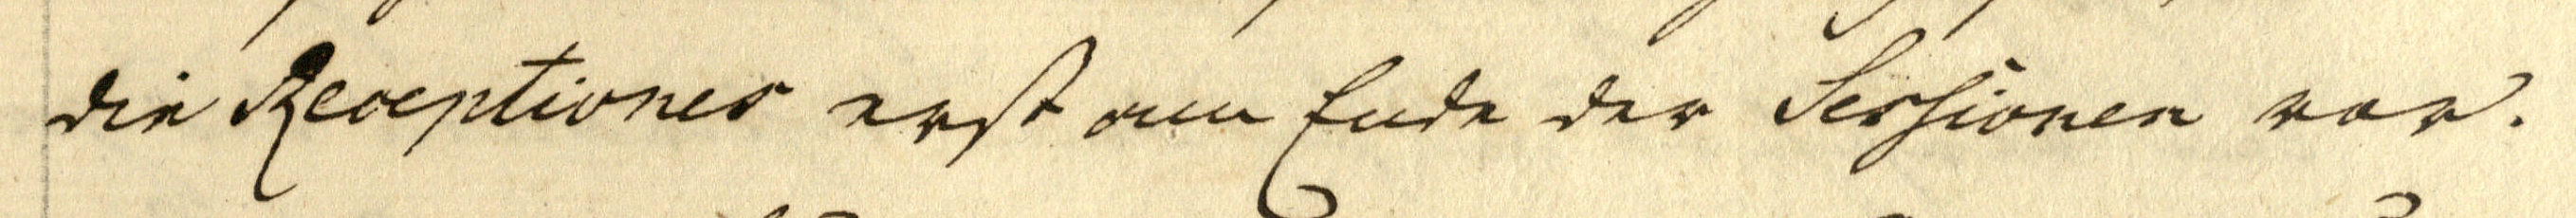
die Receptiones erst am Ende der Sessionen vor-
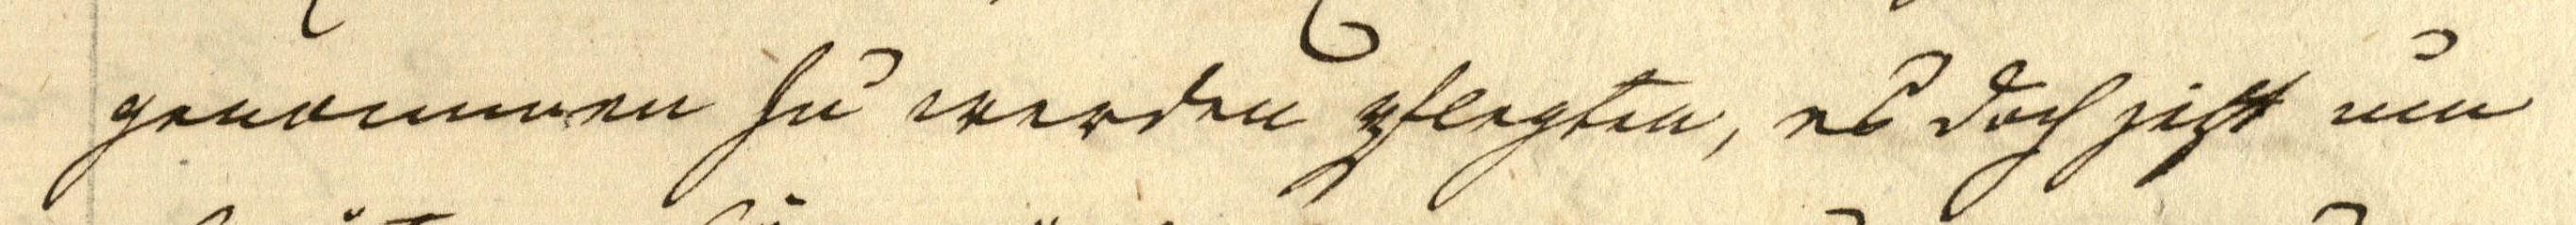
genommen zu werden pflegten, es doch jetzt um
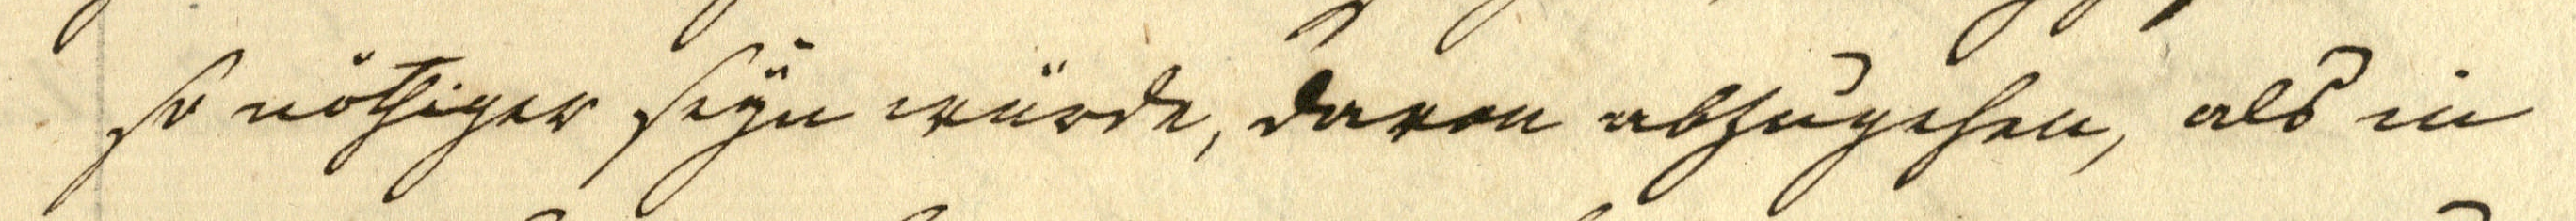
so nöthiger seyn würde, davon abzugehen, als in
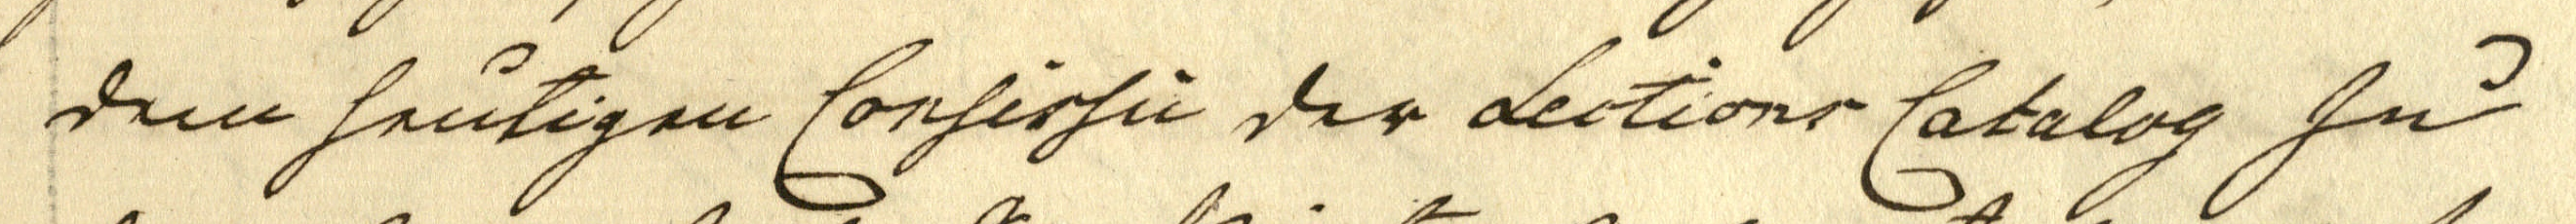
dem heutigen Consessu der Lections Catalog zu
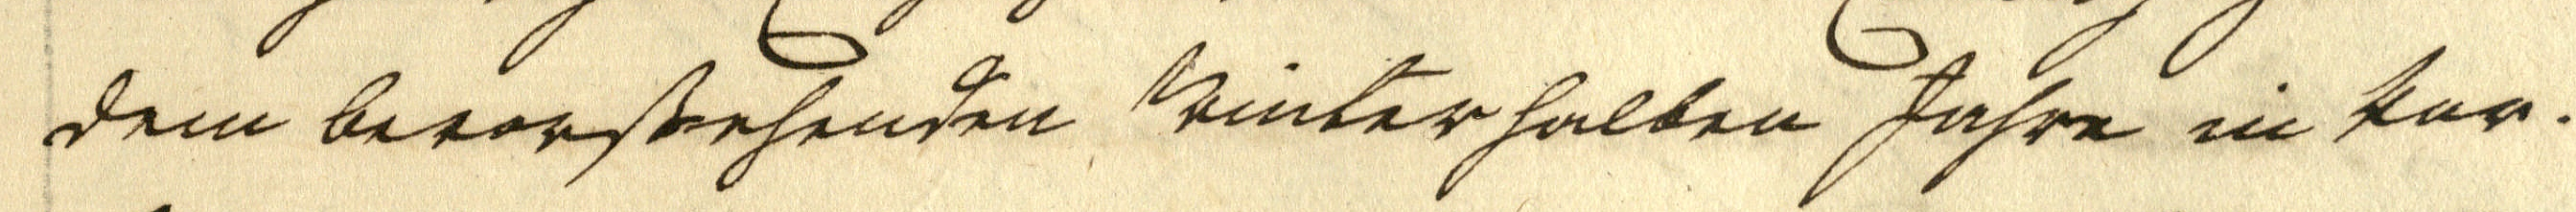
dem bevorstehenden Winterhalben Jahre in Vor-
